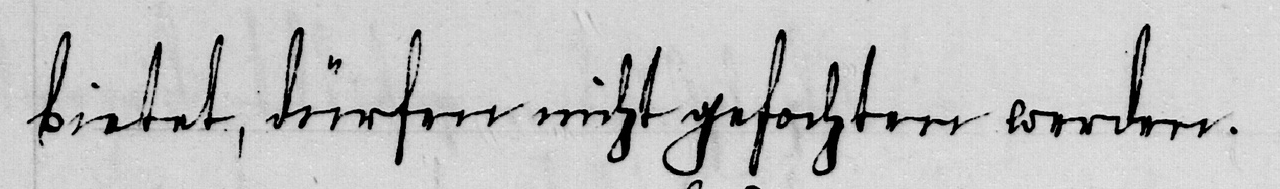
bietet, dürfen nicht gefochten werden.
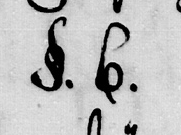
§. 7.
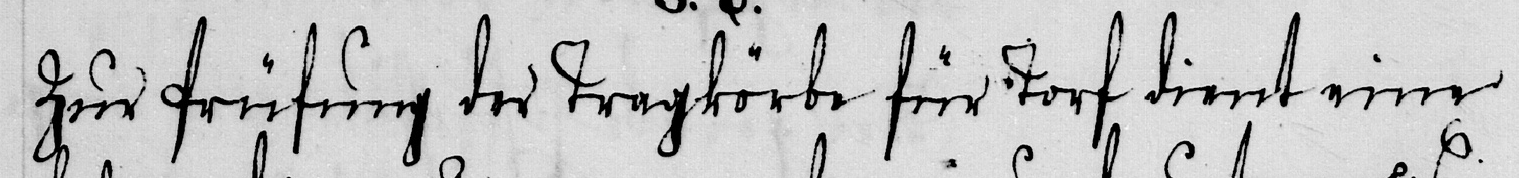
Zur Prüfung der Tragkörbe für Torf dient eine
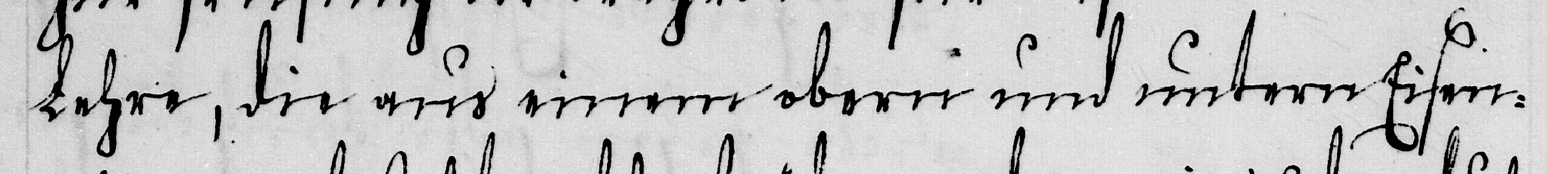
Lehre, die aus einem obern und untern Eisen¬
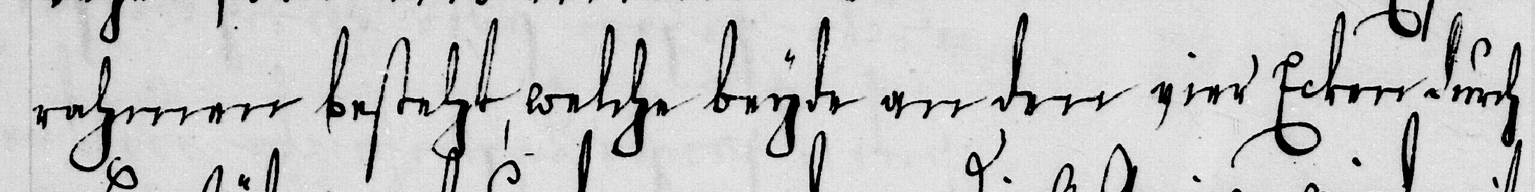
rahmen besteht, welche beyde an den vier Ecken durch
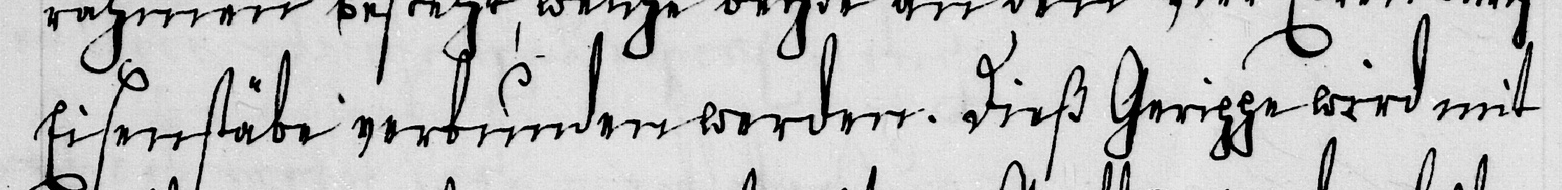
Eisenstäbe verbunden werden. Dieß Gerippe wird mit
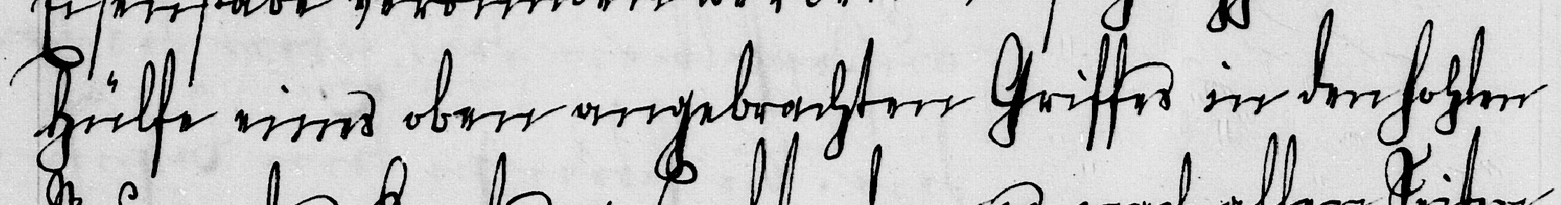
Hülfe eines oben angebrachten Griffes in den hohlen
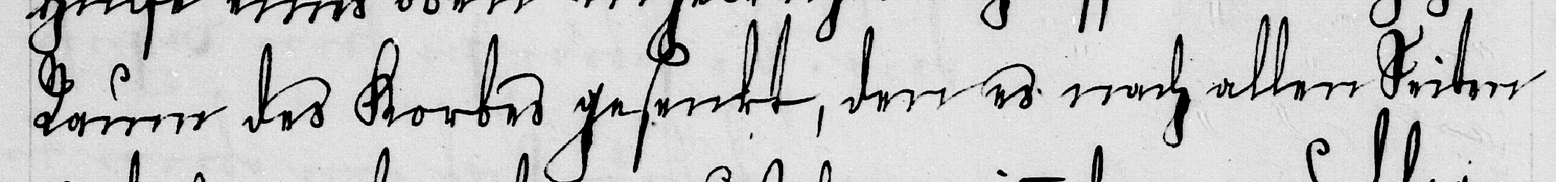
Raum des Korbes gesenkt, den es nach allen Seiten
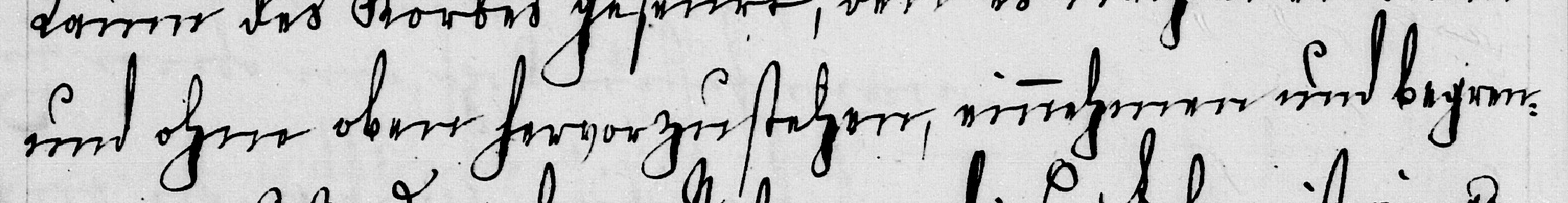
und ohne oben hervorzustehen, einnehmen und begren¬
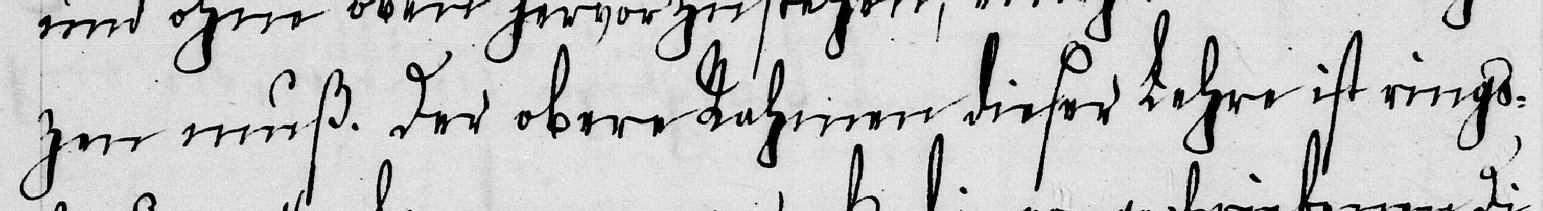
zen muß. Der obere Rahmen dieser Lehre ist rings¬
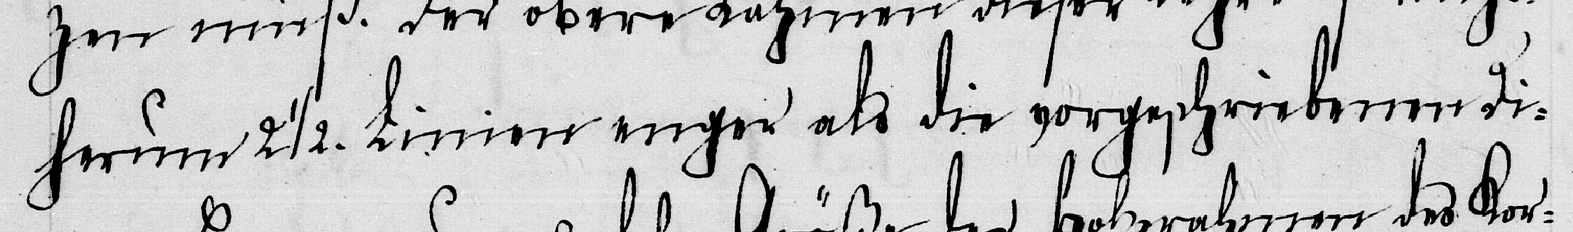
herum 2 1/2. Linien enger als die vorgeschriebenen Di¬
